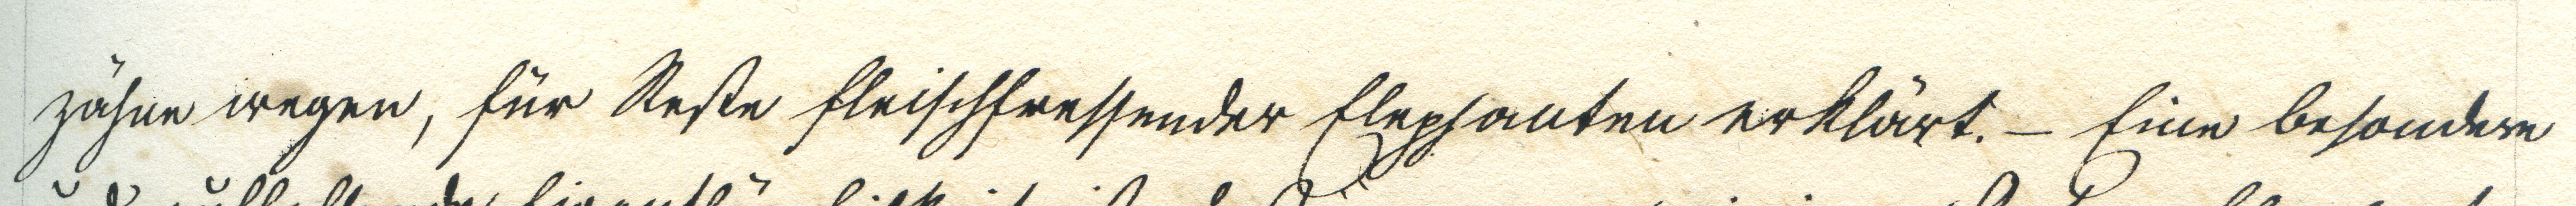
zähne wegen, für Reste fleischfressender Elephanten erklärt. – Eine besondere
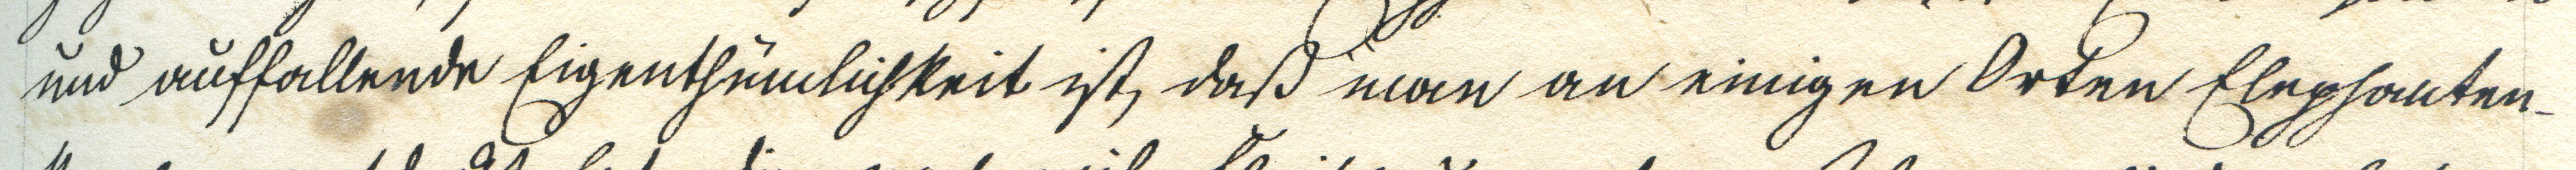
und auffallende Eigenthümlichkeit ist, daß man an einigen Orten Elephanten-
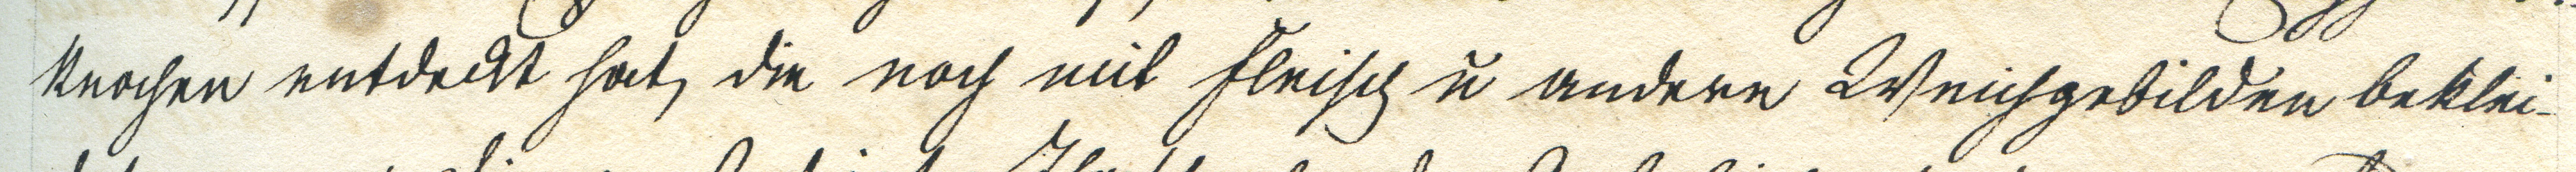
knochen entdeckt hat, die noch mit Fleisch u andern Weichgebilden beklei-
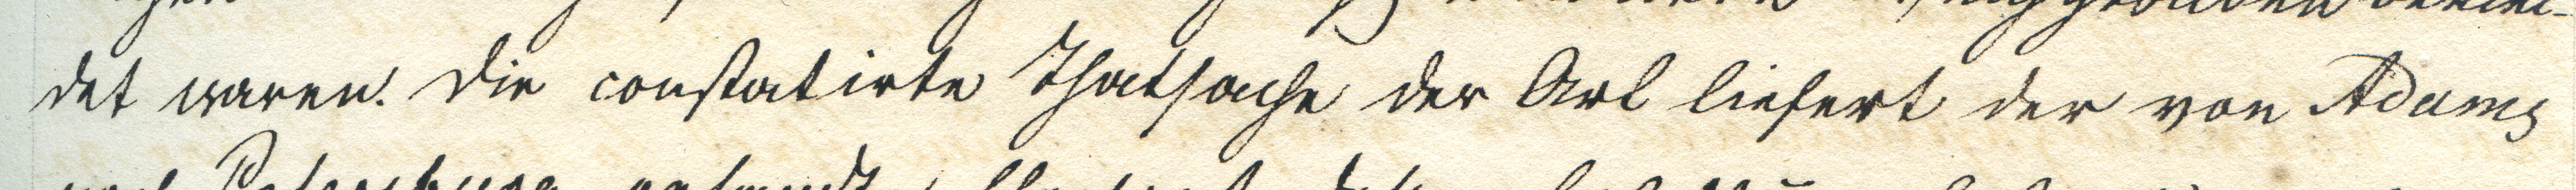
det waren. Die constatirte Thatsache der Art liefert der von Adams
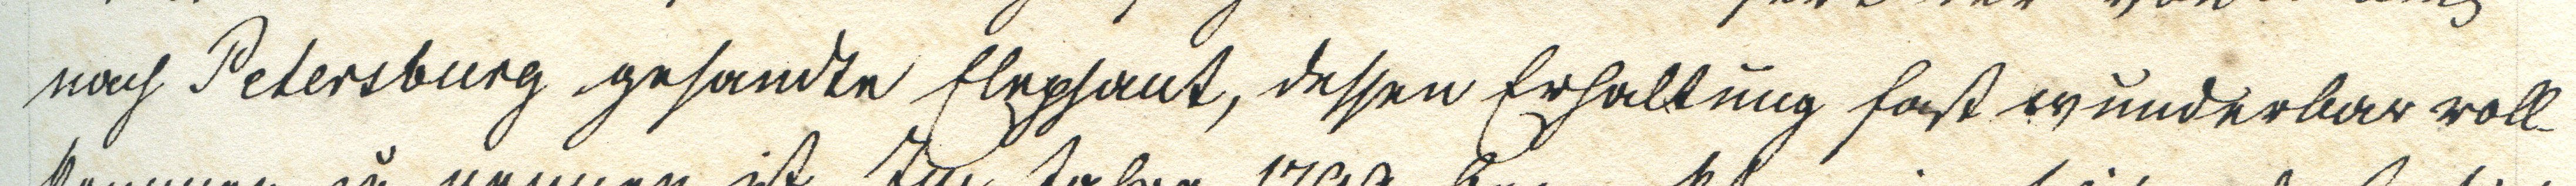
nach Petersburg gesandte Elephant, dessen Erhaltung fast wunderbar voll-
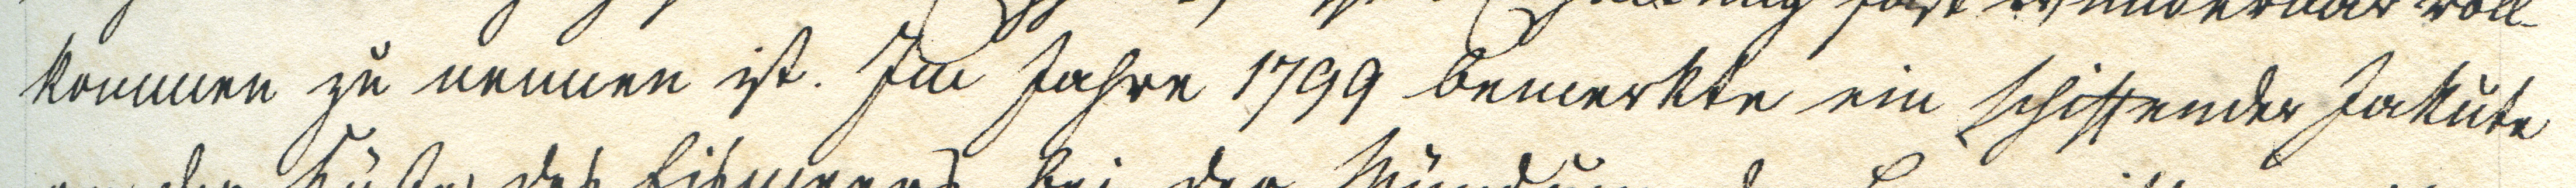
kommen zu nennen ist. Im Jahre 1799 bemerkte ein schiffender Jakute
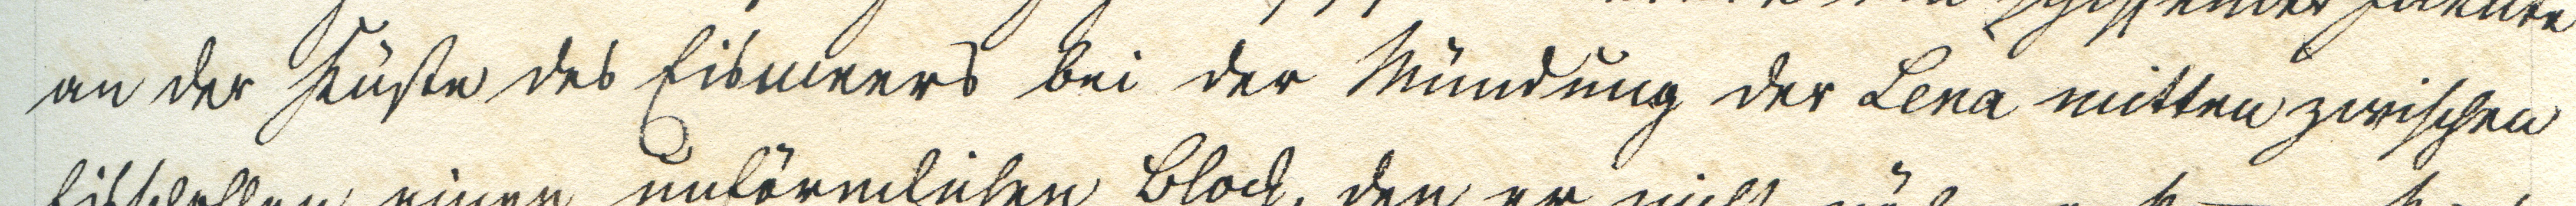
an der Küste des Eismeers bei der Mündung der Lena mitten zwischen
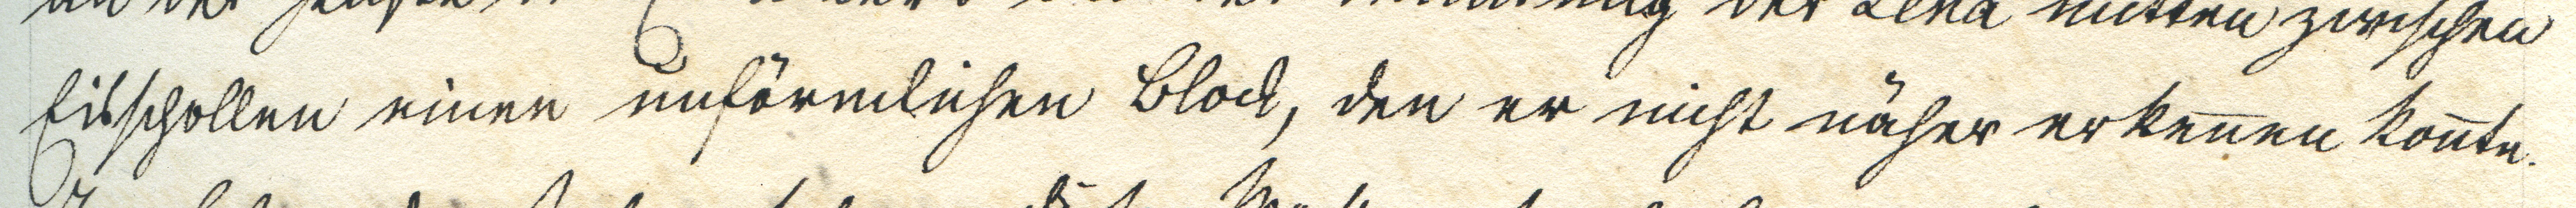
Eisschollen einen unförmlichen Block, den er nicht näher erkeñen koñte.
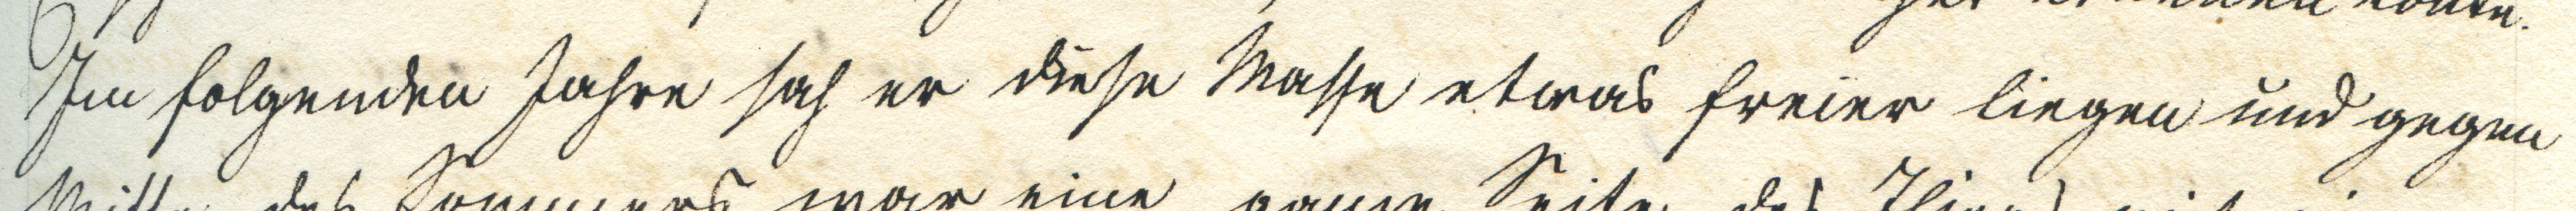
Im folgenden Jahre sah er die Masse etwas freier liegen und gegen
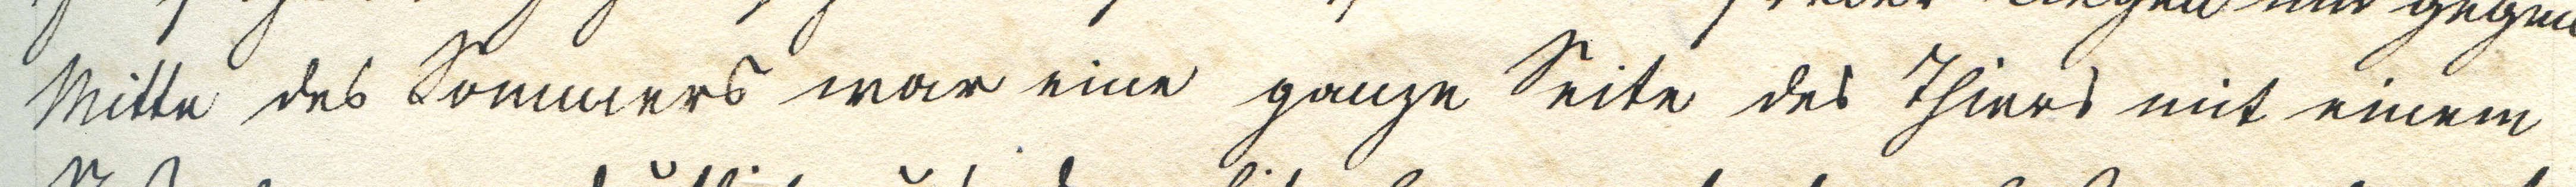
Mitte des Sommers war eine ganze Seite des Thiers mit einem
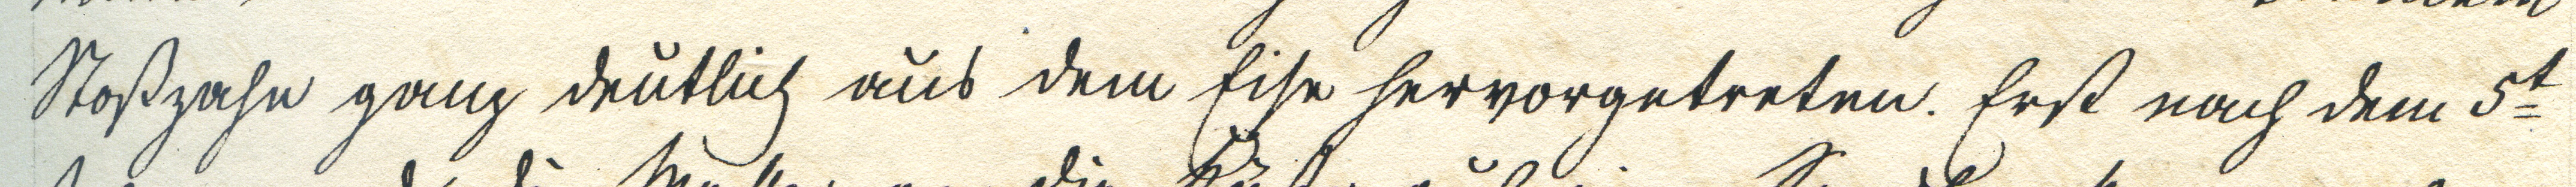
Stoßzahne ganz deutlich aus dem Eise hervorgetreten. Erst nach dem 5t
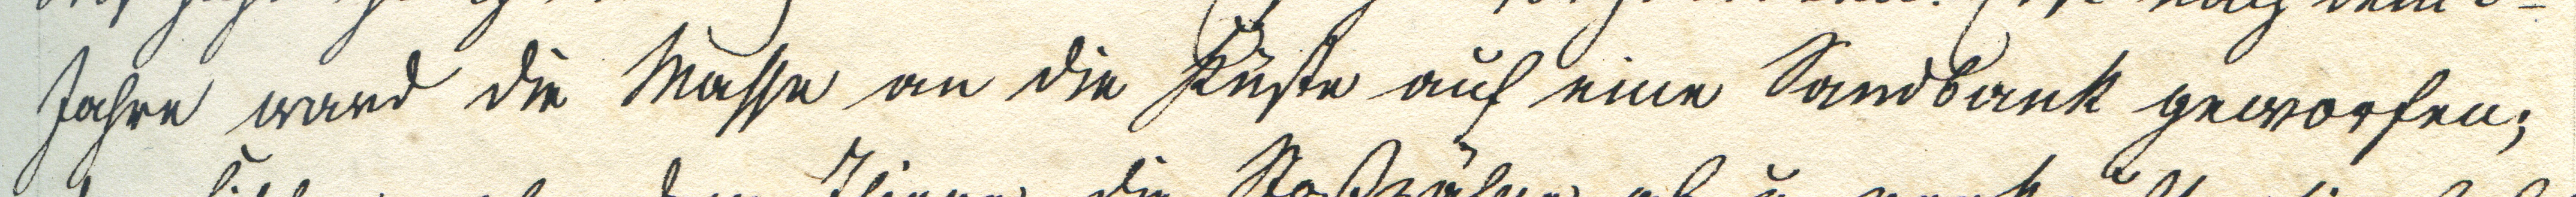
Jahre ward die Masse an die Küste auf eine Sandbank geworfen;
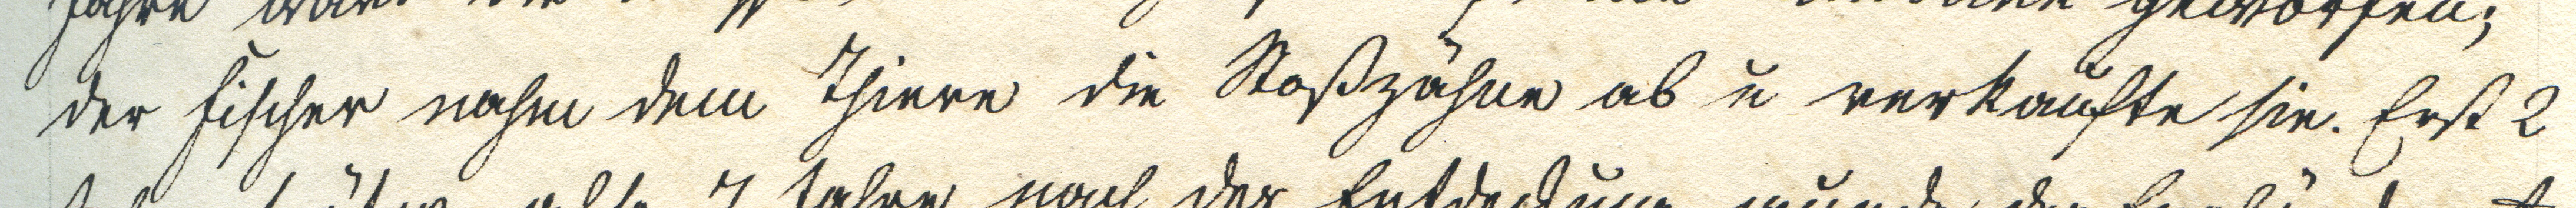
Der Fischer nahm dem Thiere die Stoßzähne ab u verkaufte sie. Erst 2
